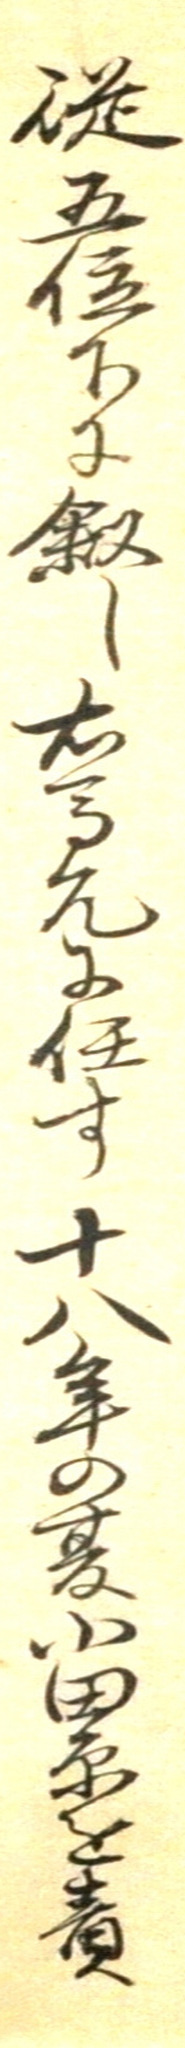従五位下に叙し右馬允に任す十八年の夏小田原を責
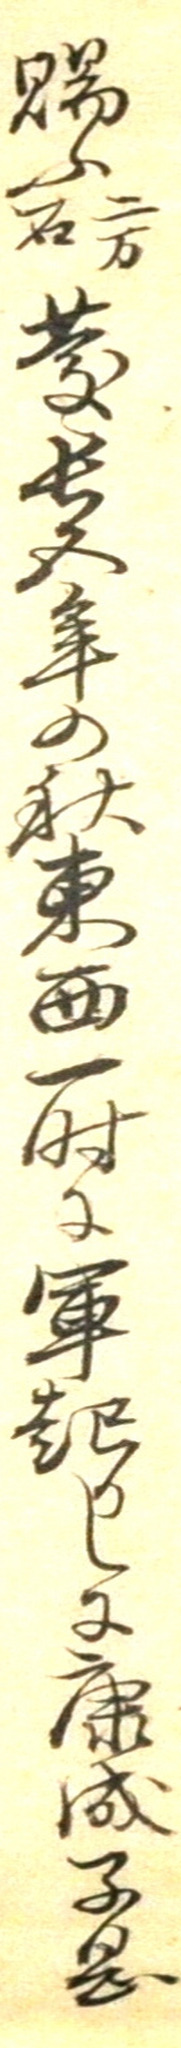賜ふ二万石慶長五年の秋東西一時に軍起りしに康成子息
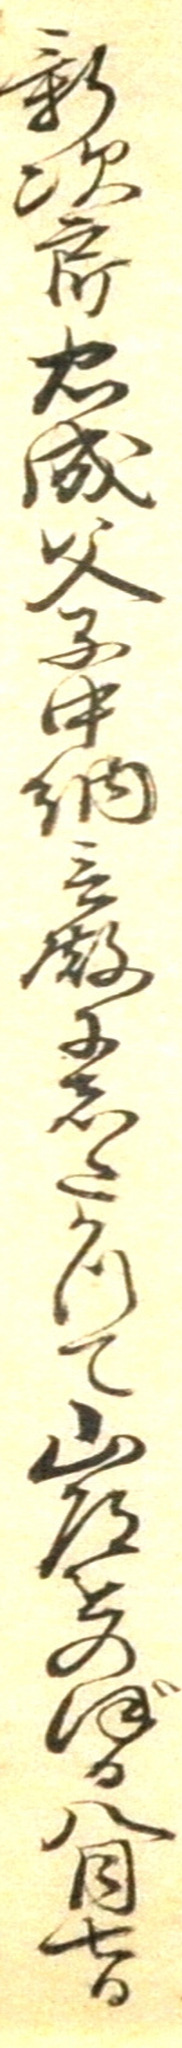新次郎忠成父子中納言殿にしたかつて山道をのぼる八月七日
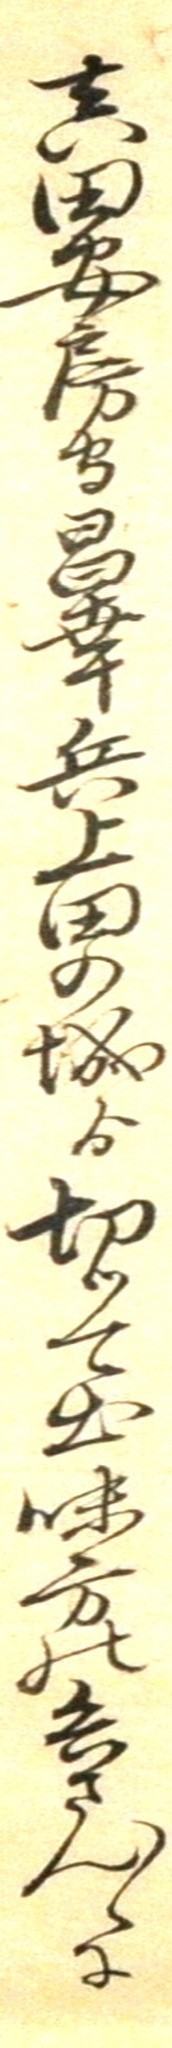真田安房守昌幸兵上田の城より切ッて出味方の兵さん〳〵に
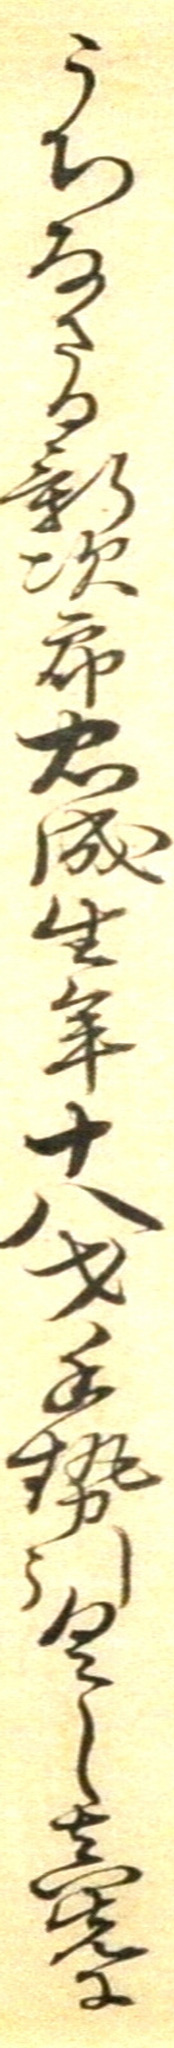うちなさる新次郎忠成生年十八才手勢引具し真先に
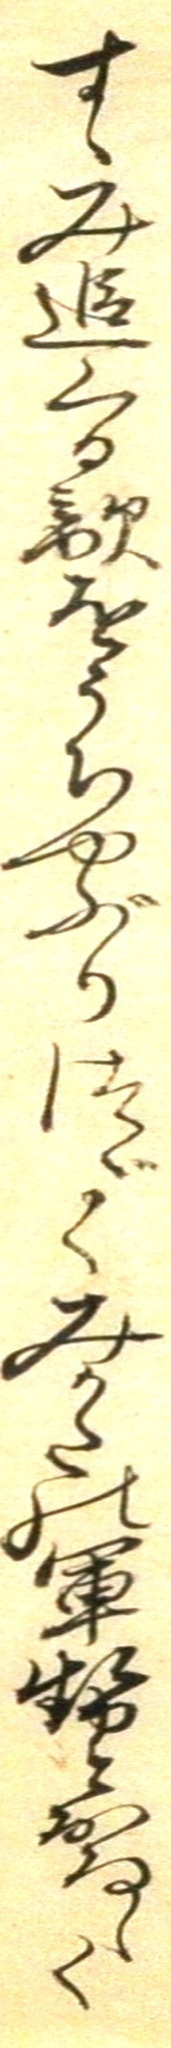すゝみ追くる敵をうちやぶりつゞくみかたの軍勢とおなしく
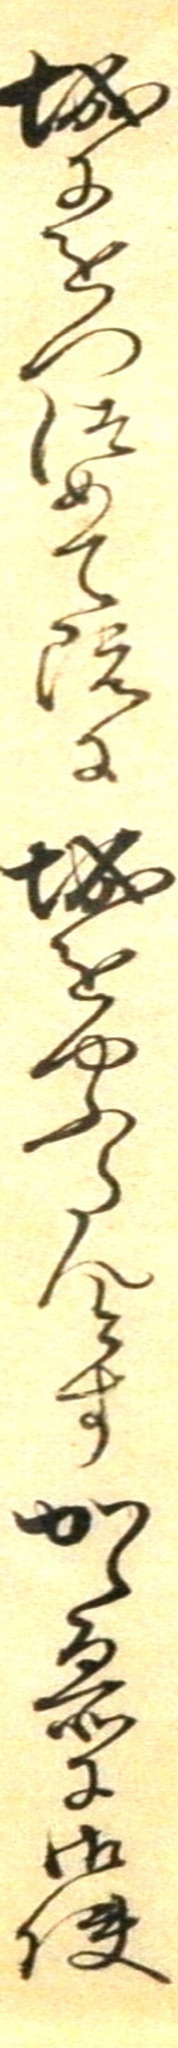城にをつつめて既に城をやふらんとすかゝる所に御使
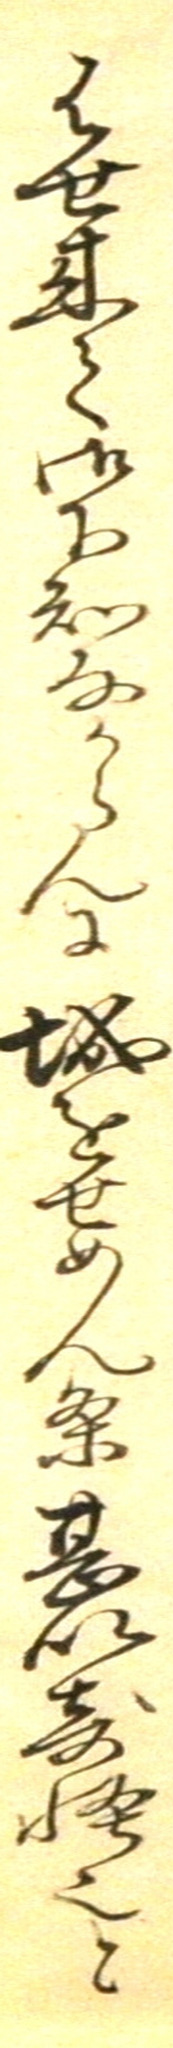はせ来て御下知なからんに城をせめん条甚以奇怪也と
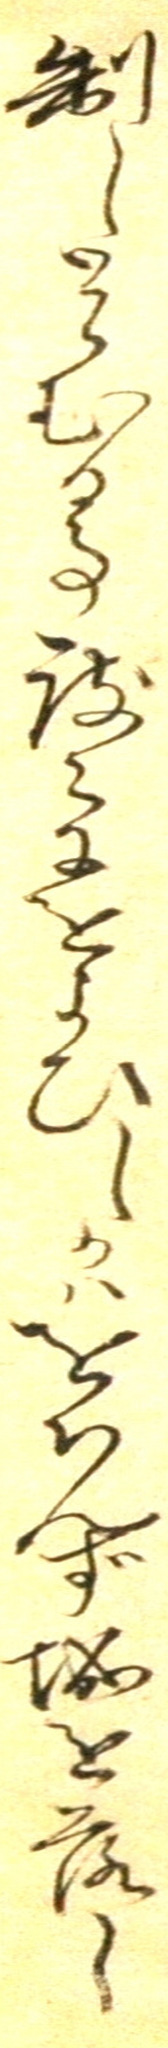制しとゝむる事度々にをよひしかはをちんず城を落し

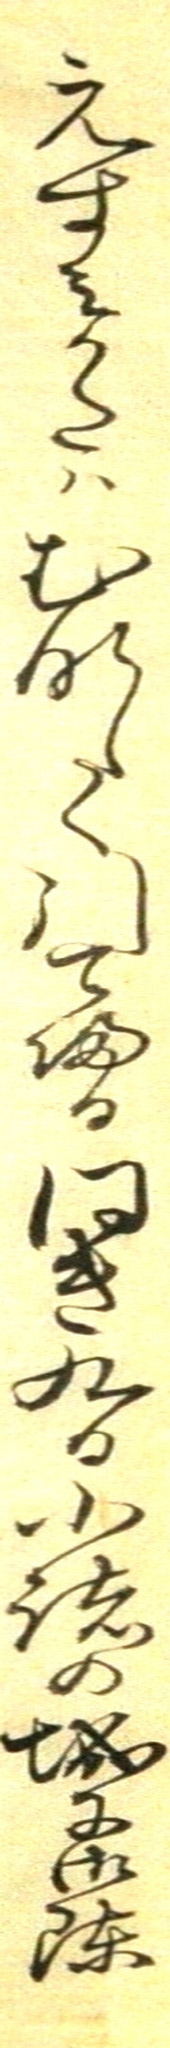えすみかたはむなしく引て帰る同き九日小諸の城に御陣
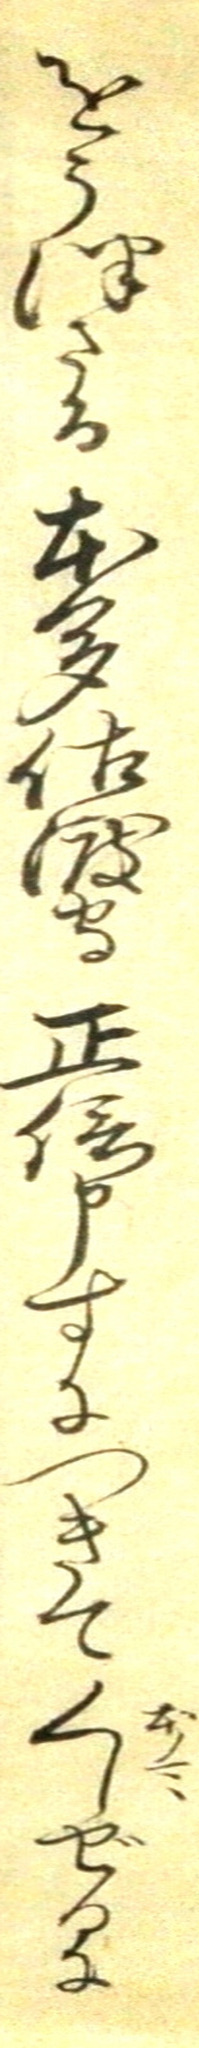をうつさる本多佐渡守正信申すにつきてくしぜるに
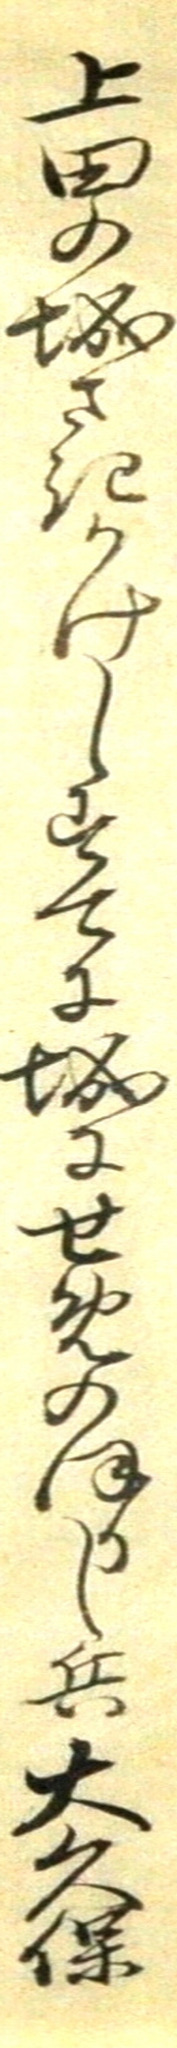上田の城さきかけしすてに城にせめのほりし兵大久保
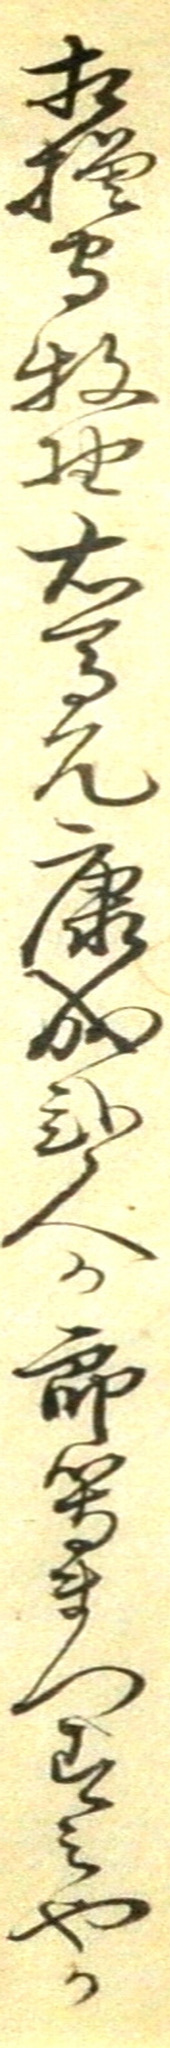相模守牧野右馬允康成弐人か郎等まつすみやか
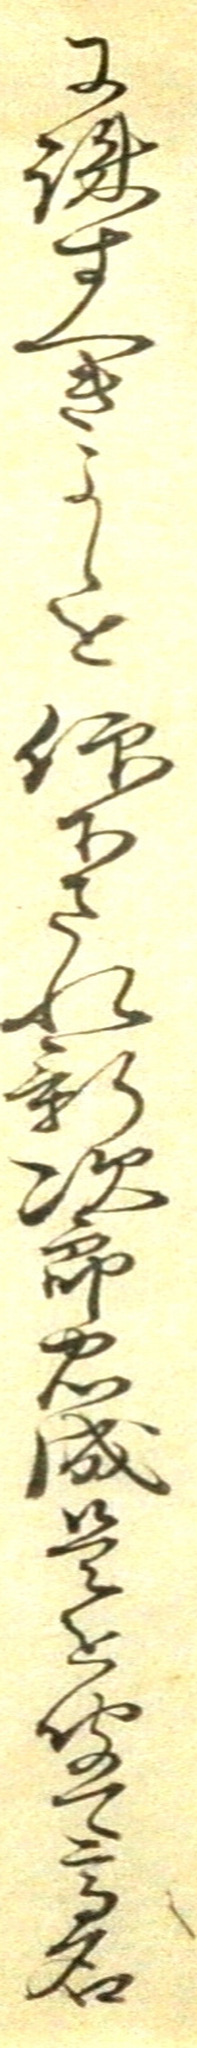に誅すへきよしを仰下され新次郎忠成是を聞て高名
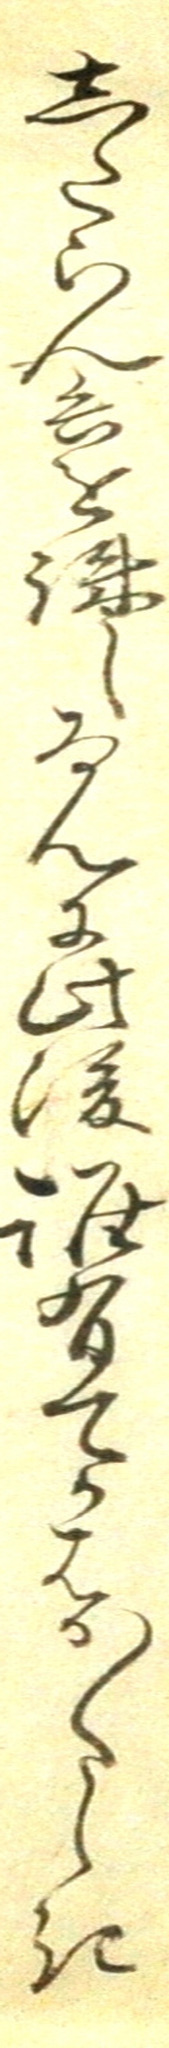したらん兵を誅しなんに此後誰有てかはる〳〵しき
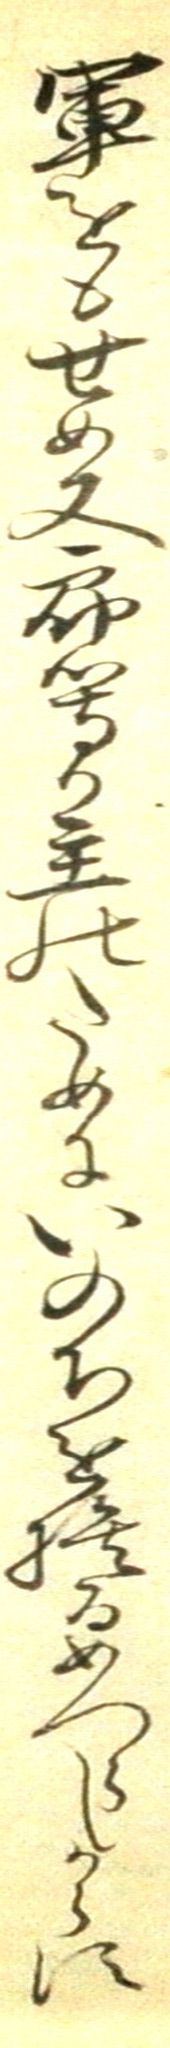軍をもせめ又郎等か主のためにいのちを捨てるめつらしからす
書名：藩翰譜（四・下）
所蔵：伊那市立高遠町図書館・合同会社AMANE
